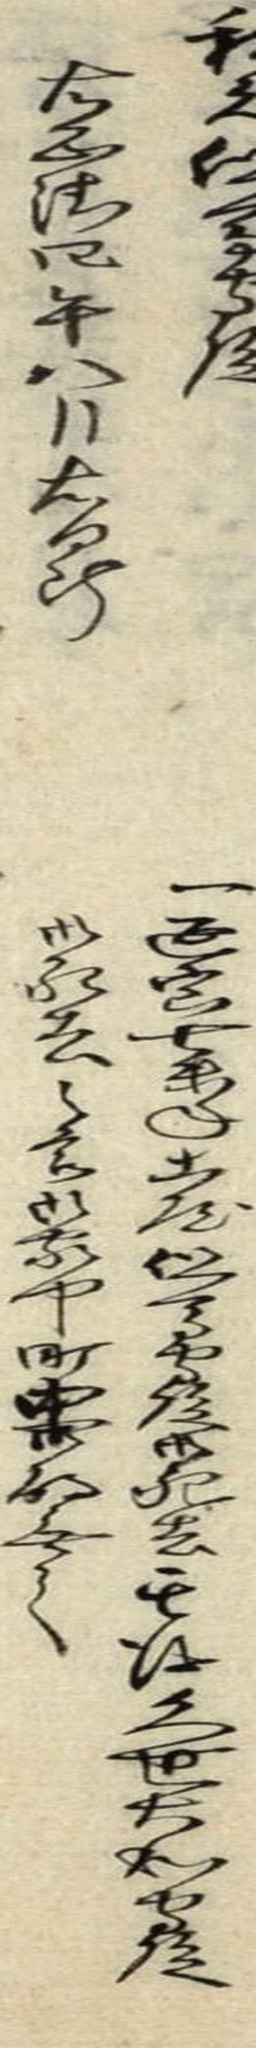右正徳四午八月右同断御死去之節御家中町中御触無之
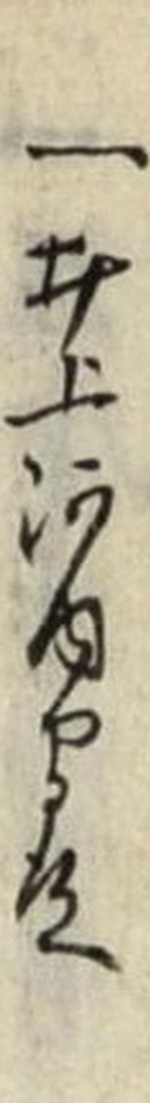一井上河内守殿
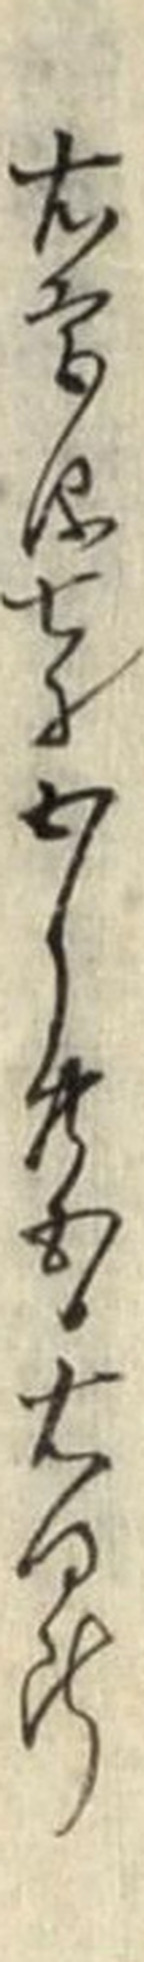右享保七刁五月廿五日右同断
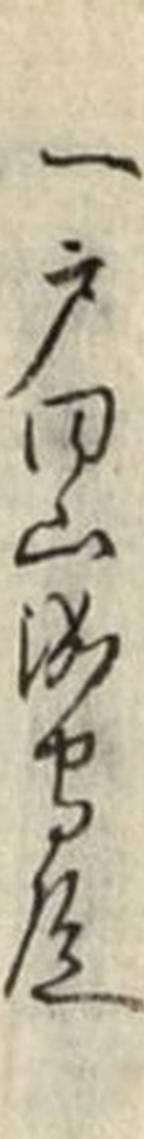一戸田山城守殿
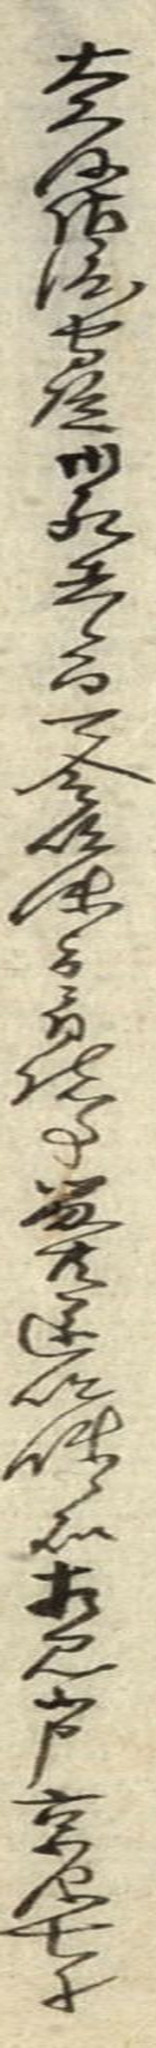大久保佐渡守殿御死去候間可令吟味旨に付諸事留共遂吟味候処相見不申享保七刁
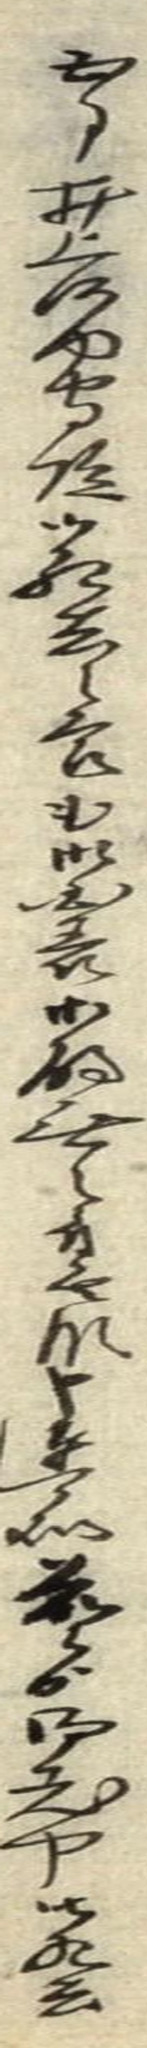五月井上河内守殿御死去之節も御国表御触無之に付其段申達候処前々ゟ御老中御死去
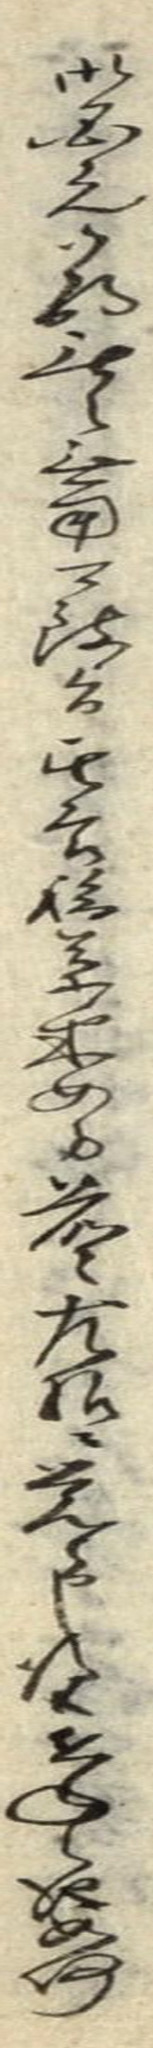御国元御触無之無用可致旨其節稲葉采女方前々左様に覚へ申候得共近年之儀如何
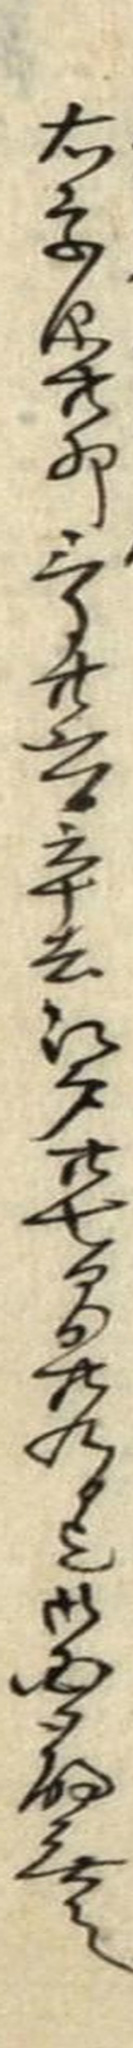右享保廿卯三月廿六日卒去江戸廿七日ゟ廿九日迄御国御触無之
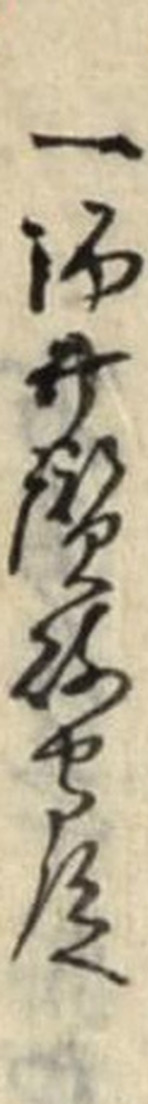一酒井讃岐守殿

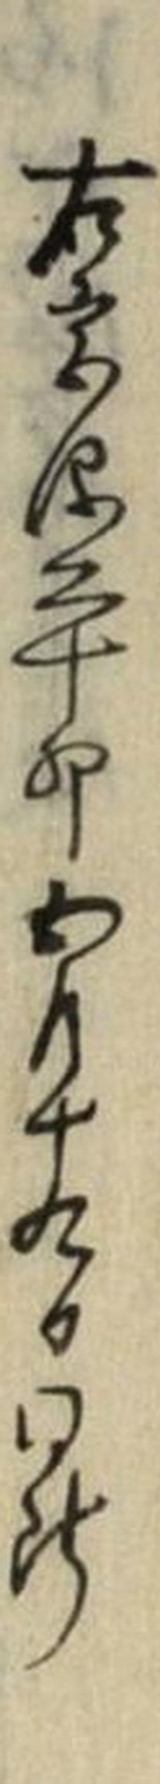右享保二十卯五月十九日同断
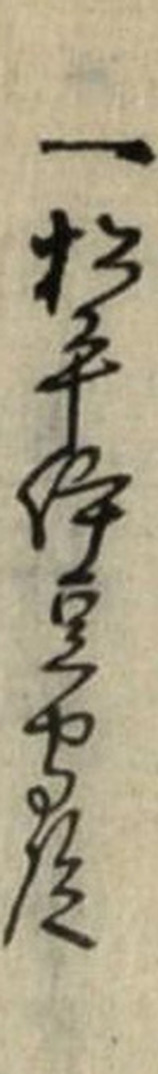一松平伊豆守殿
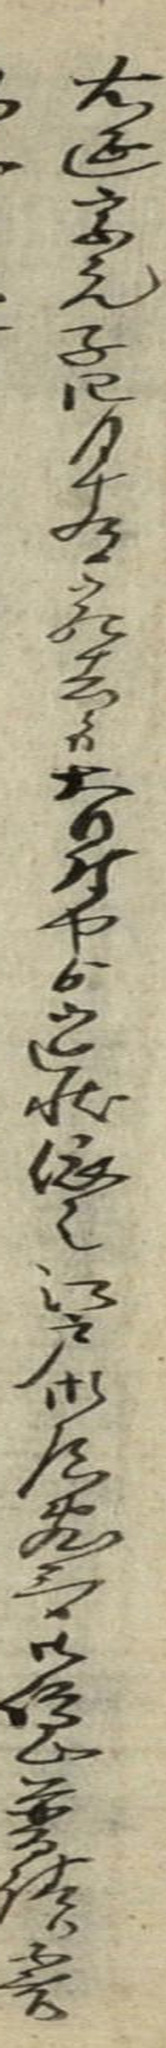右延享元子四月十九日御死去に付大目付中ゟ御廻状依之江戸御屋敷三日御停止普請は不苦
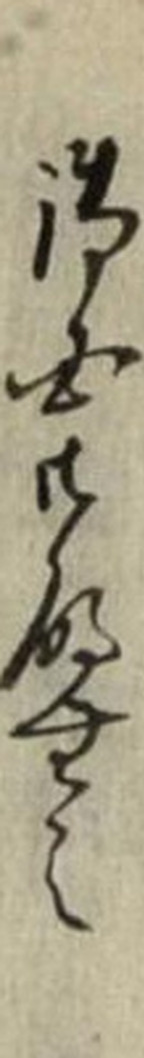御国御触無之
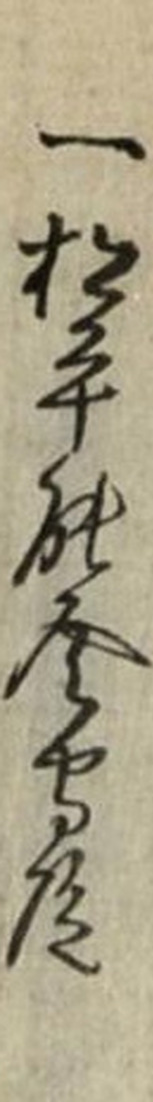一松平能登守殿
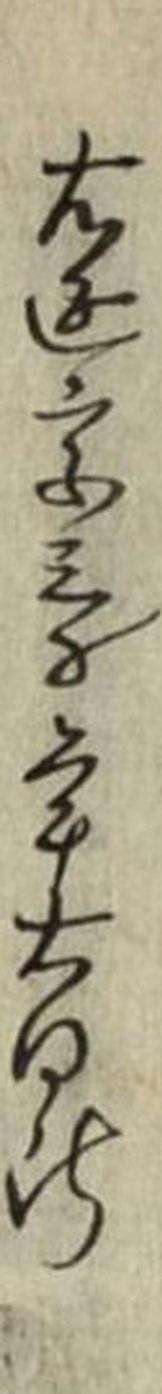右延享三刁年右同断
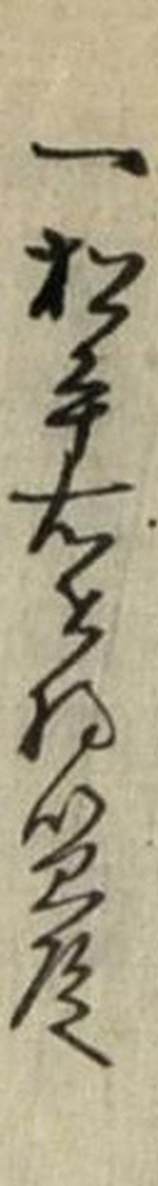一松平右近将監殿
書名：御停止異変死失
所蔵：福井県文書館 Fukui Prefectural Archives
